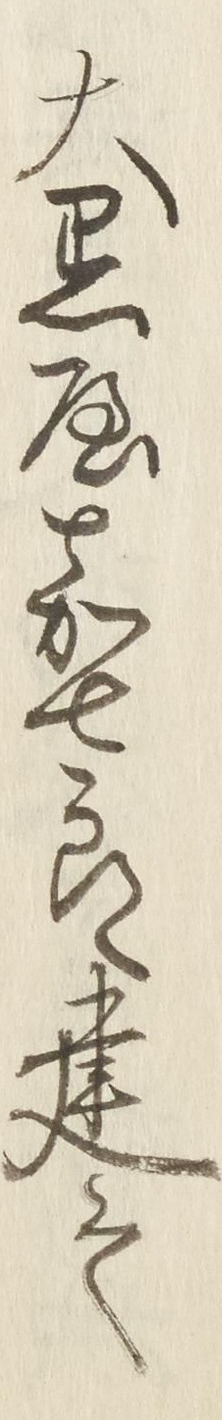大黒屋嘉七郎建之
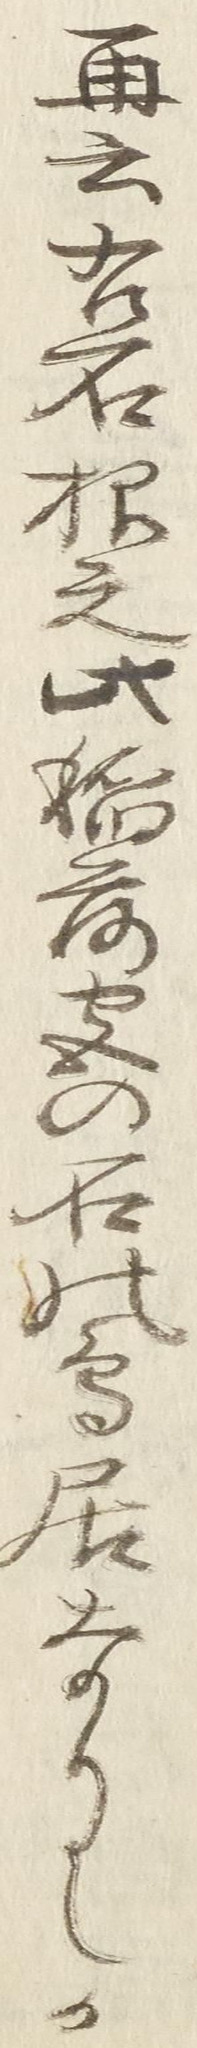再云右石根元此稲荷宮のの鳥居なりしか
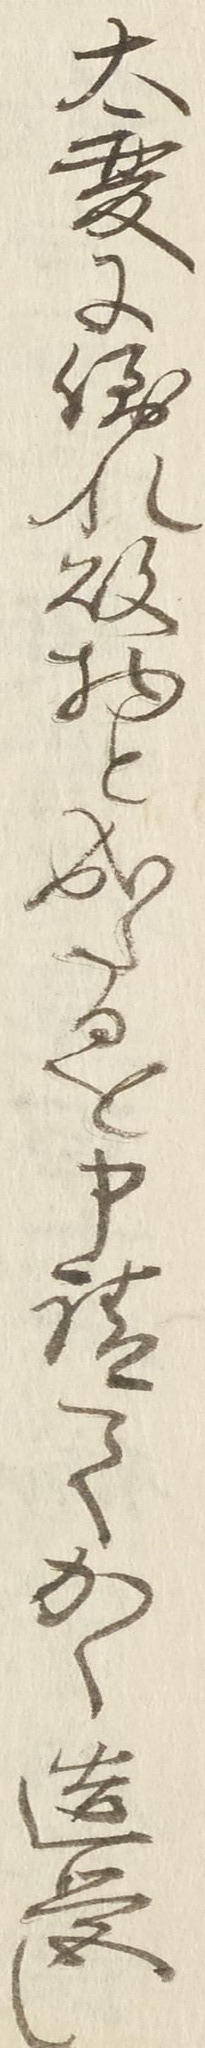大変に倒れ故物と成たるを申請てかく造営し
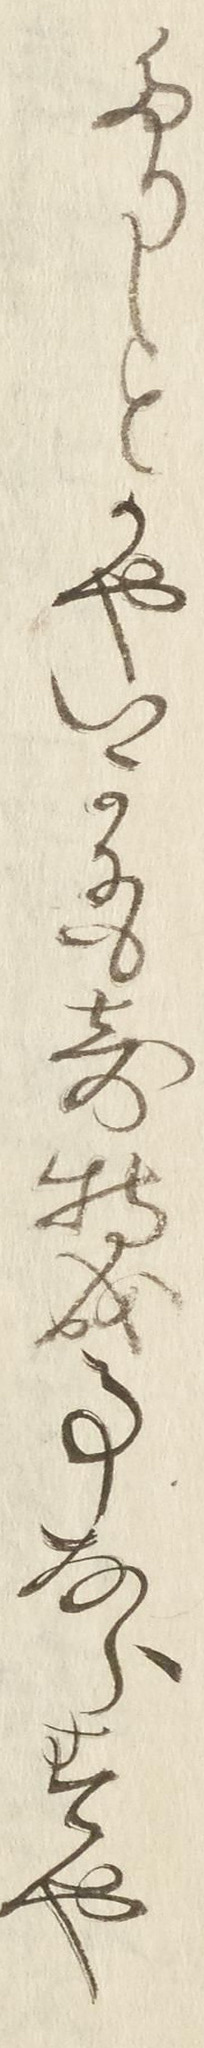たりしとかやいかにも奇特成事ならすや
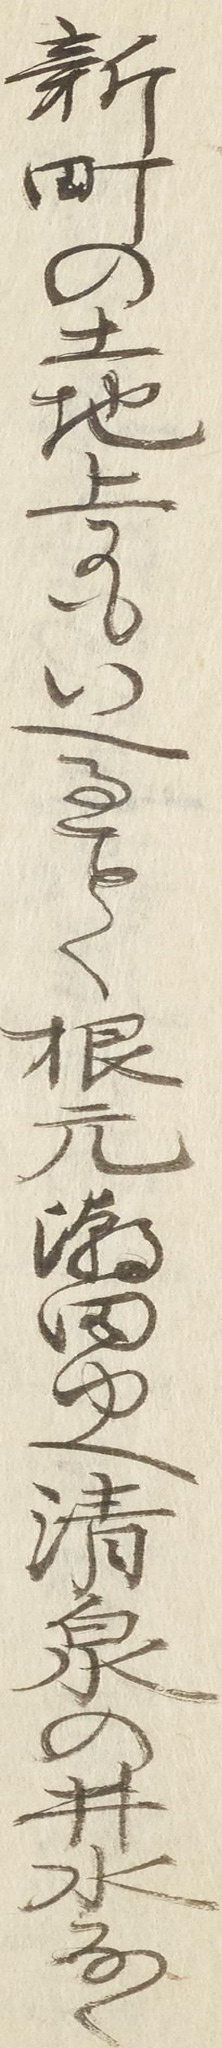新町の土地上にもいへることく根元潮田ゆへ清泉の井水なく
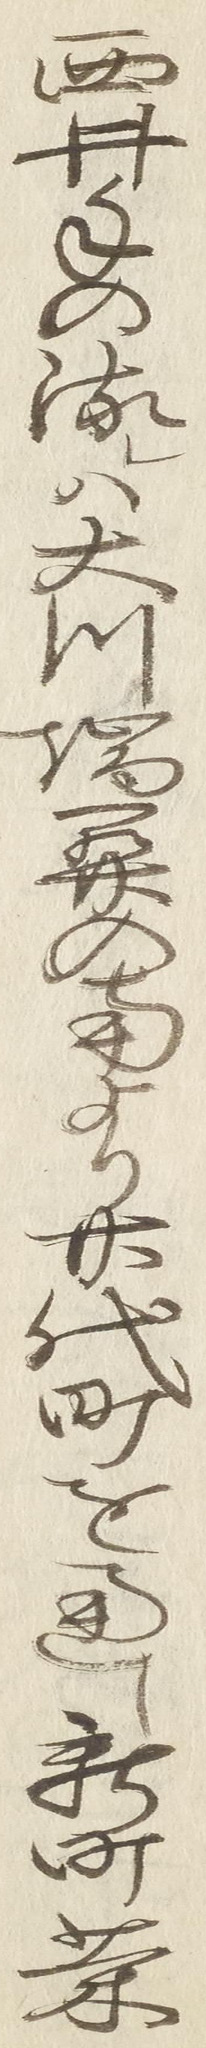西井手の流れは大川端関の南より廿代町を通し新町菜
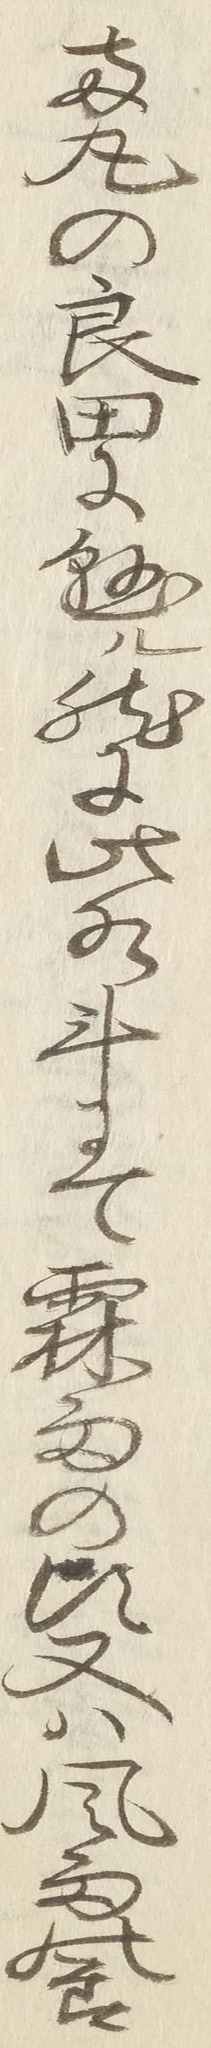両丸の良田に懸る然に此水斗にて霖雨の頃又は風雨の節
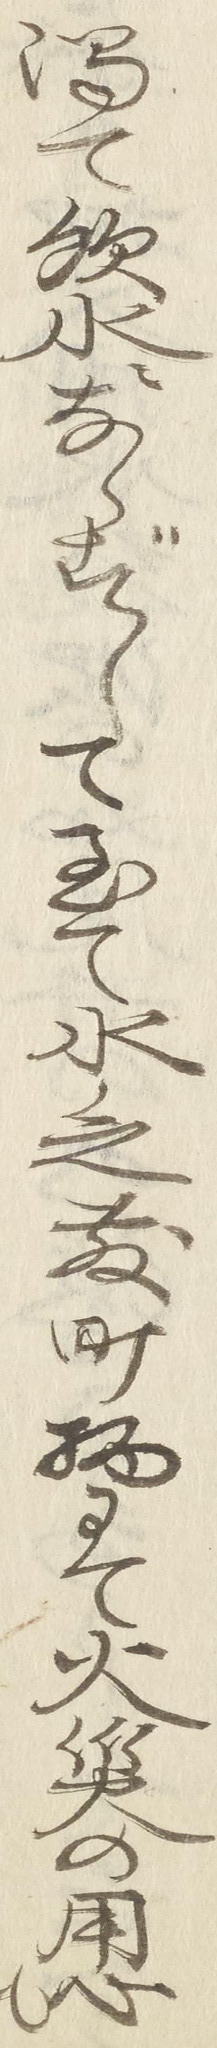渇て飲水にならずして至て水乏敷町柄にて火災の用心も
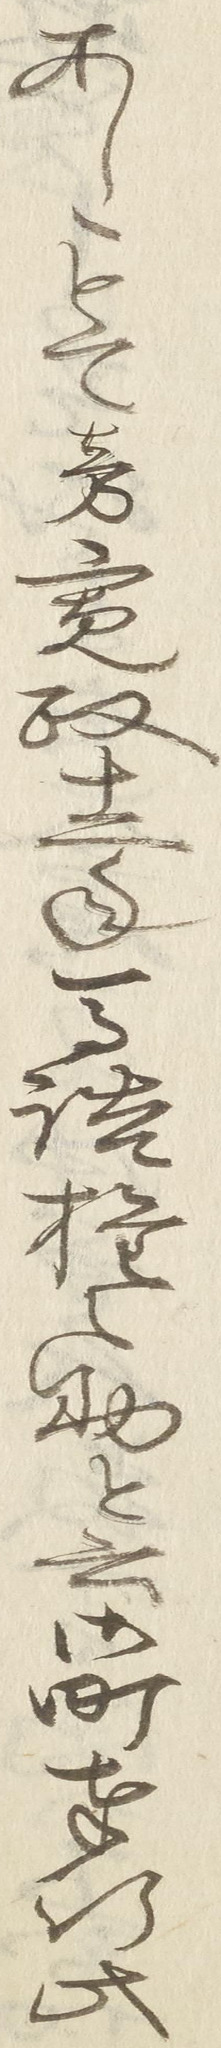あしことて旁寛政十二年馬詰権之助と云御町奉行此
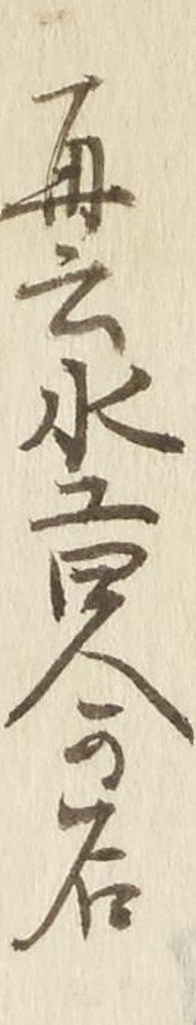再云水工四人か名
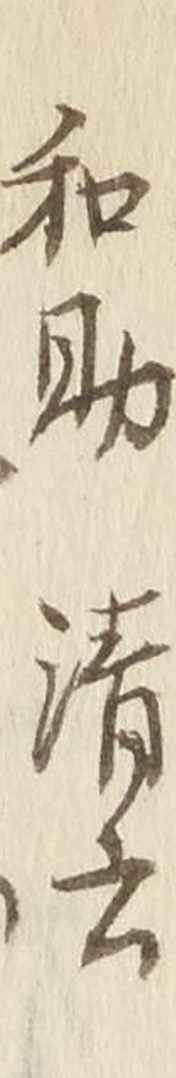和助清六
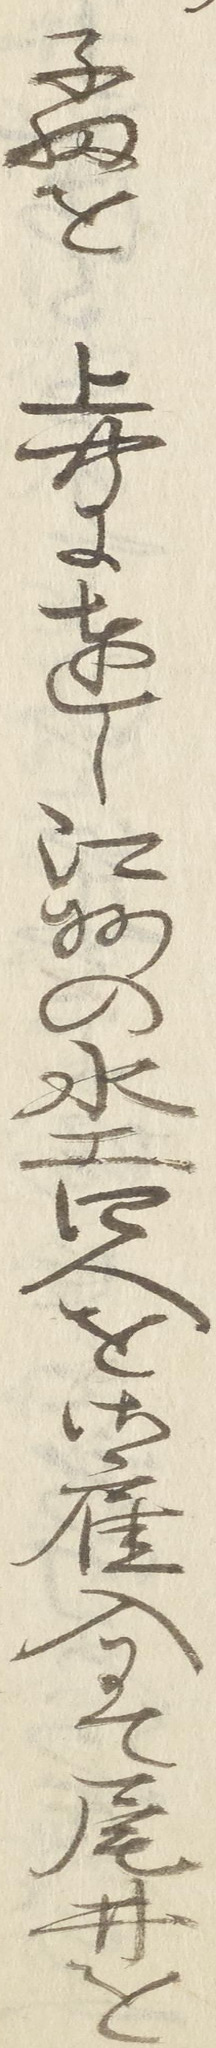子細を上聞に達し江州の水工四人を御雇入にて尾井を
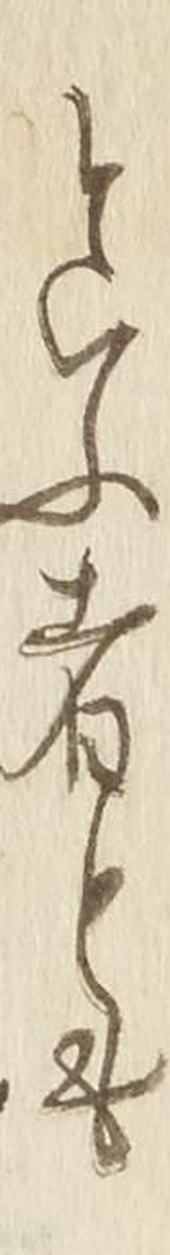といふ者とも
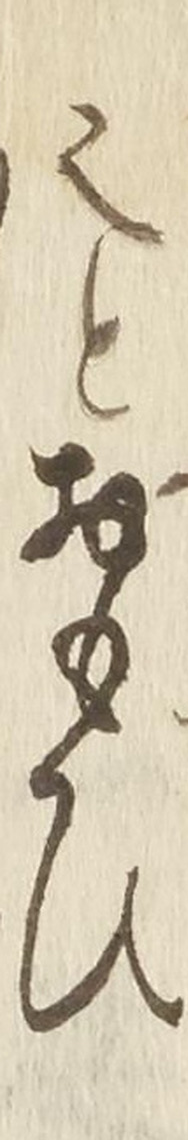也とおもひ
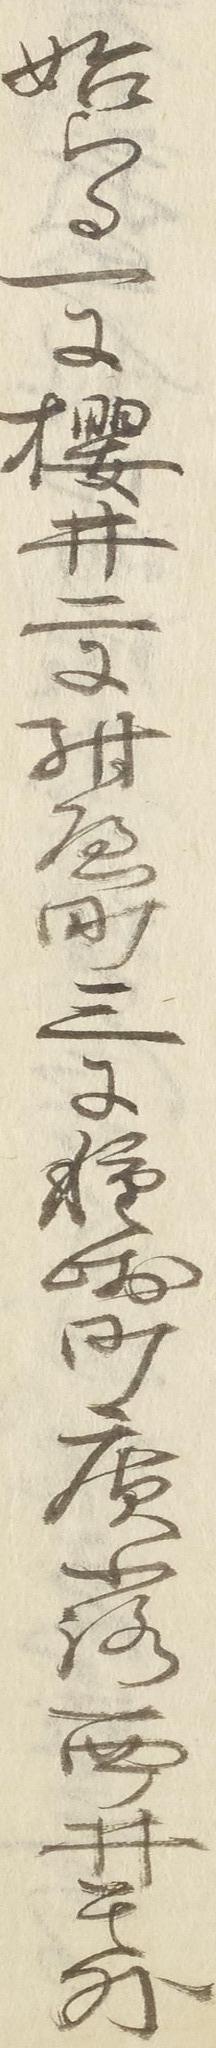始らる一に桜井二に紺屋町三に種崎町広小路西の井其外
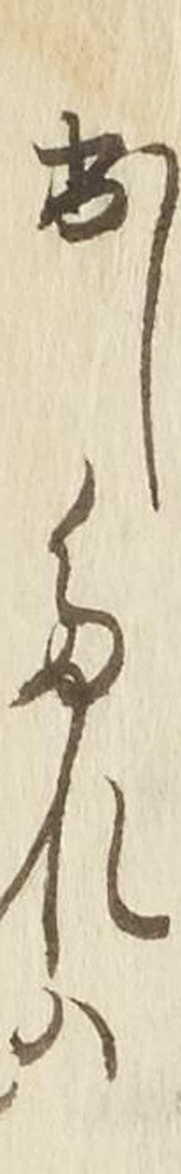出したれは
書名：地震記　上
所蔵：東京大学地震研究所図書室 Earthquake Research Institute Library, The University of Tokyo, JAPAN
